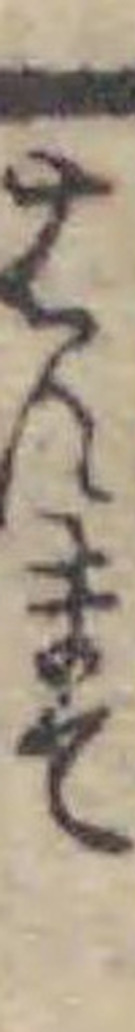はんまて
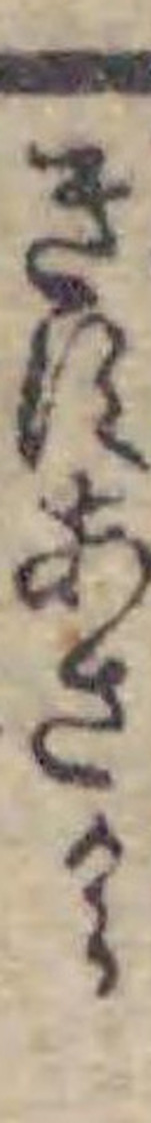きすあさから
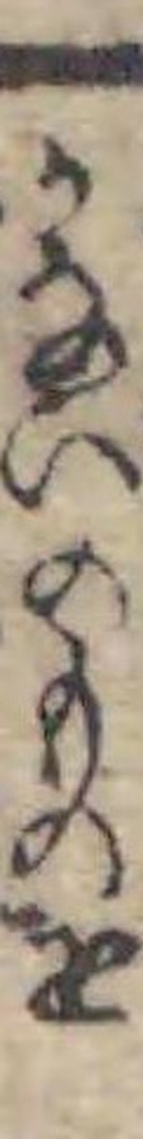かないのものを
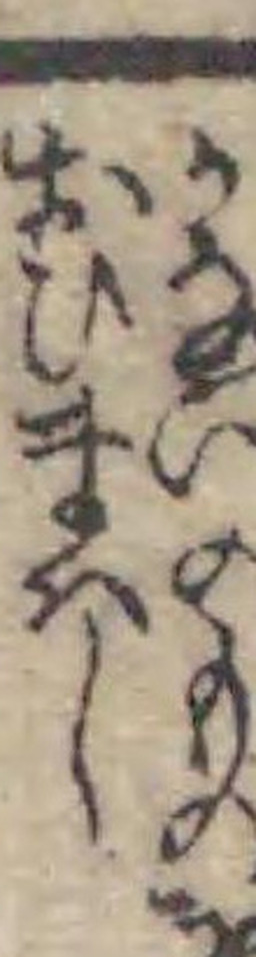おひまはし
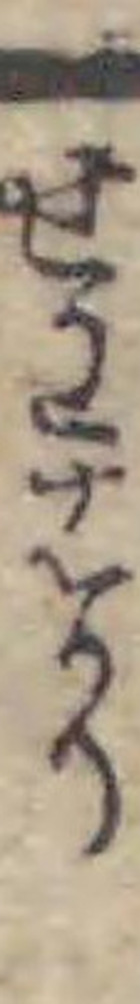せわはかり
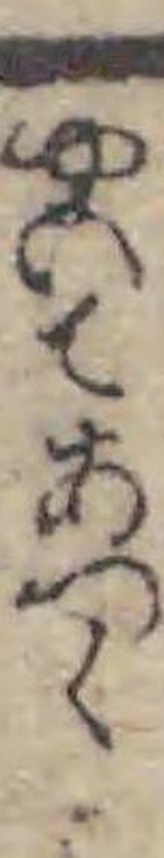やいてあつく
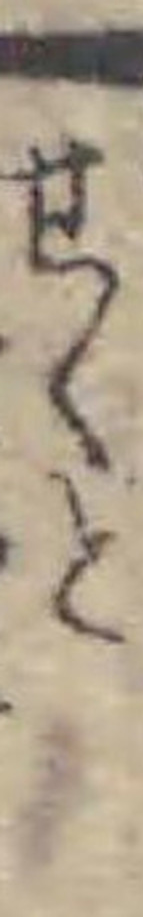せくと
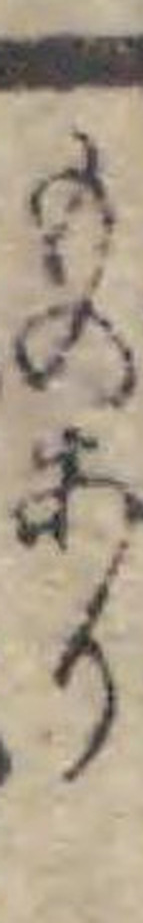ものあり
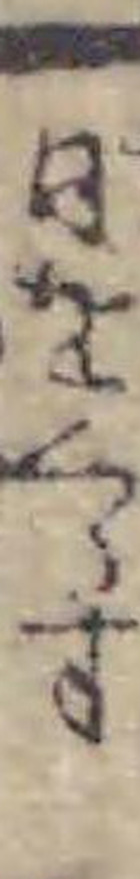日をくらす
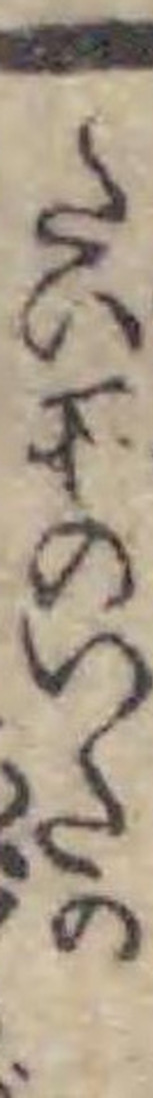たい所のいたの
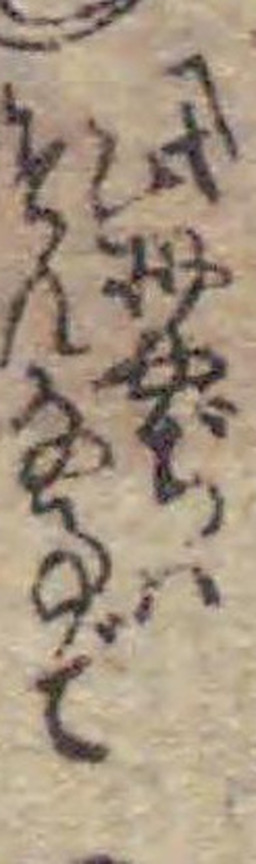そんな事で
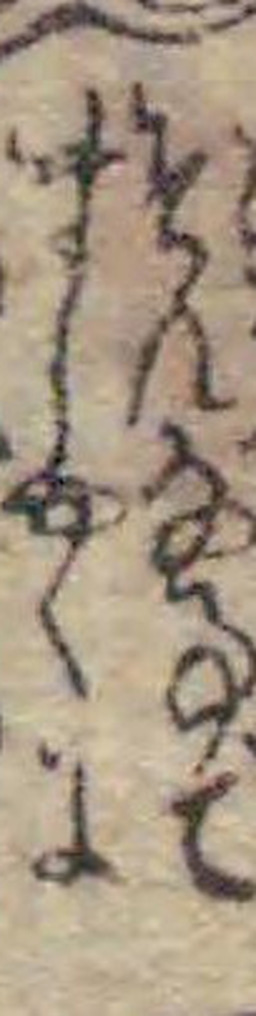ましやくに
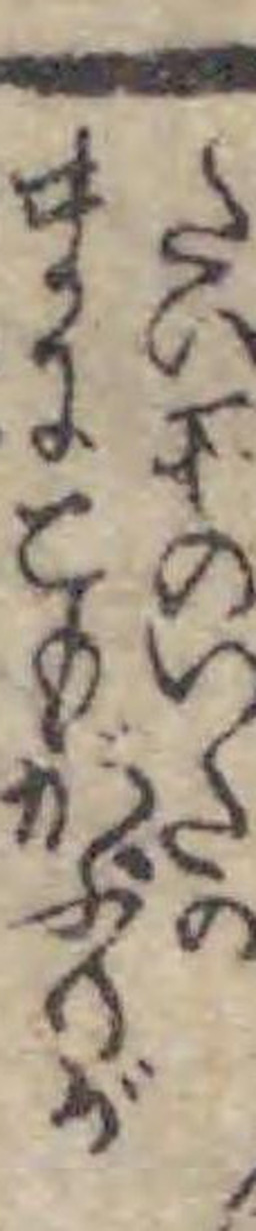まにこもがぶりが
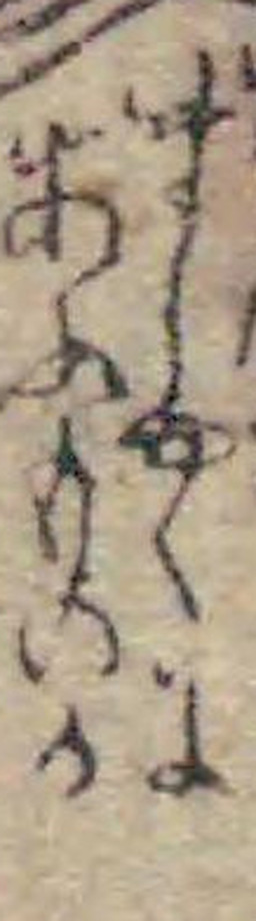あふものか
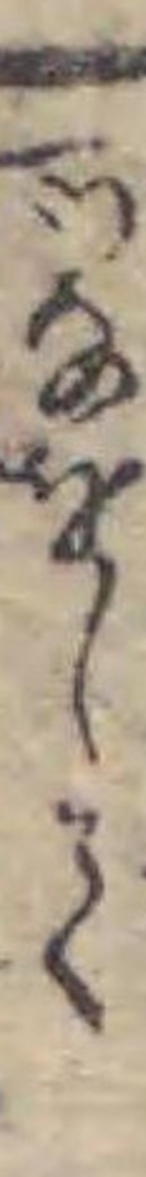一つなをして
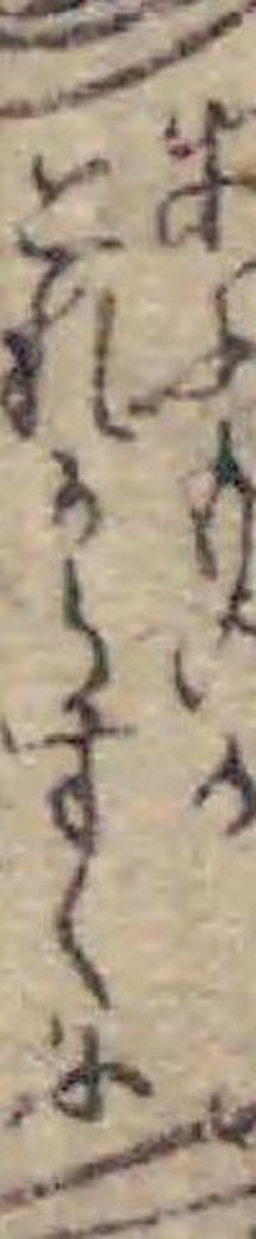これからすくに
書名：新鋳小判 : 3巻
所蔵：国立国会図書館 National Diet Library, JAPAN
